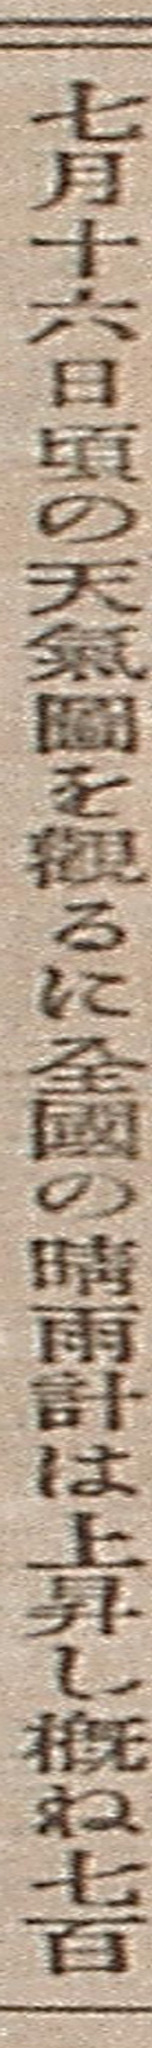七月十六日頃の天気図を観るに全国の晴雨計は上昇し概ね七百
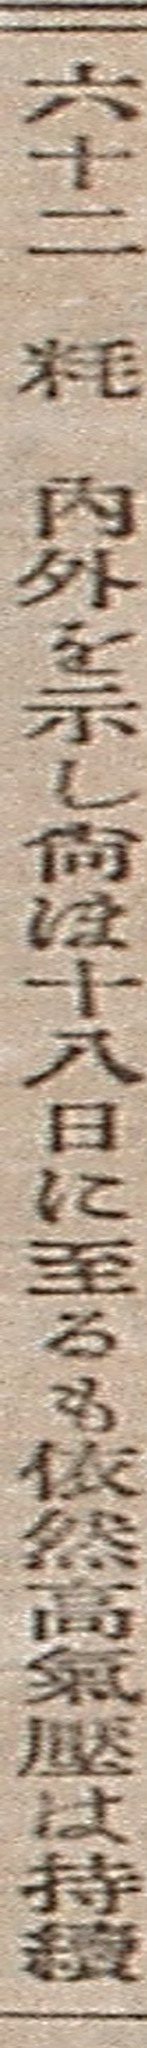六十二粍内外を示し尚ほ十八日に至るも依然高気圧は持続
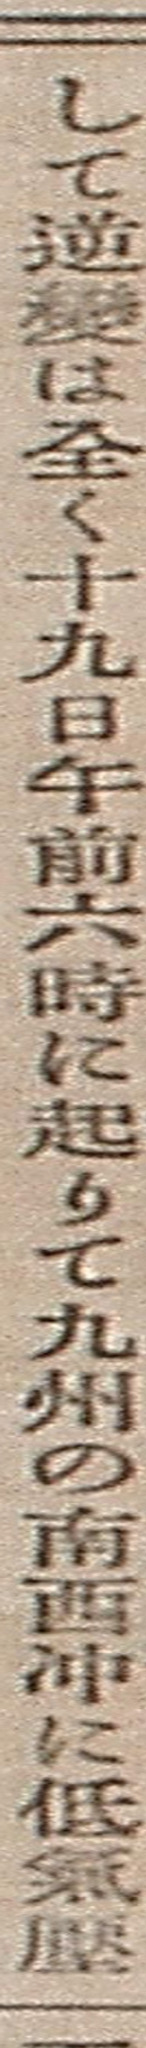して逆変は全く十九日午前六時に起りて九州の南西沖に低気圧
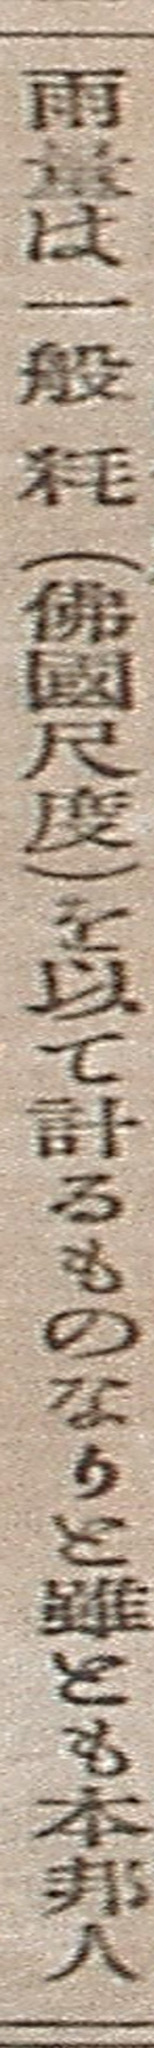雨量は一般粍を以て計るものなりと雖とも本邦人
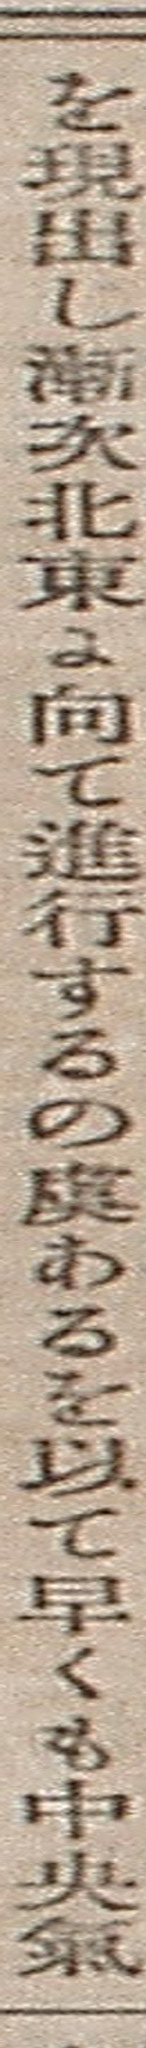を現出し漸次北東に向て進行するの虞あるを以て早くも中央気
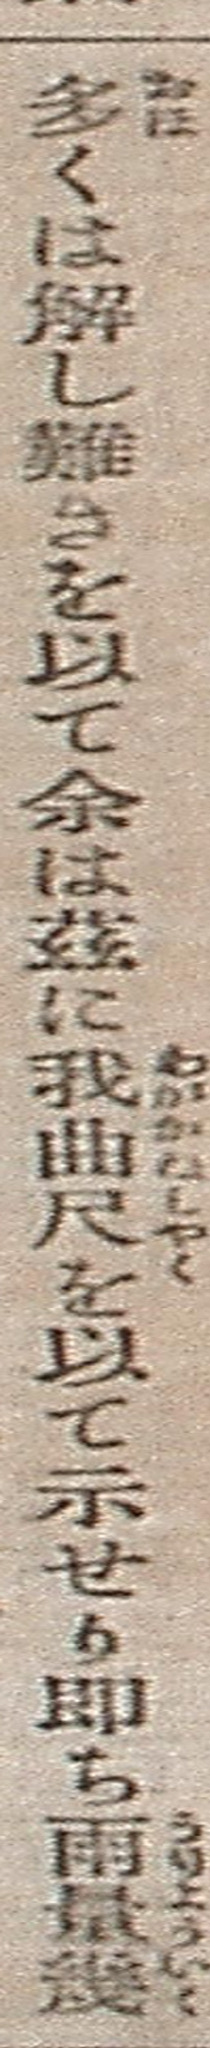多くは解し難きを以て余は茲に我曲尺を以て示せり即ち雨量幾
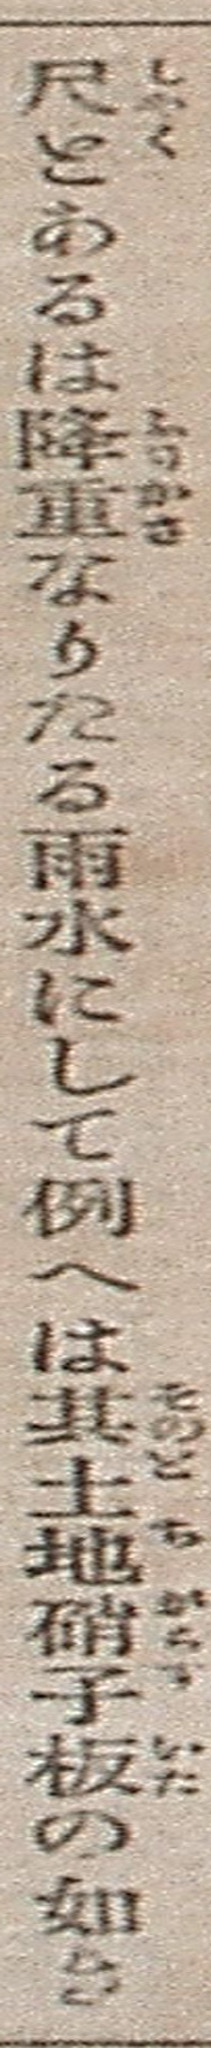尺とあるは降重なりたる雨水にして例へは其土地硝子板の如き
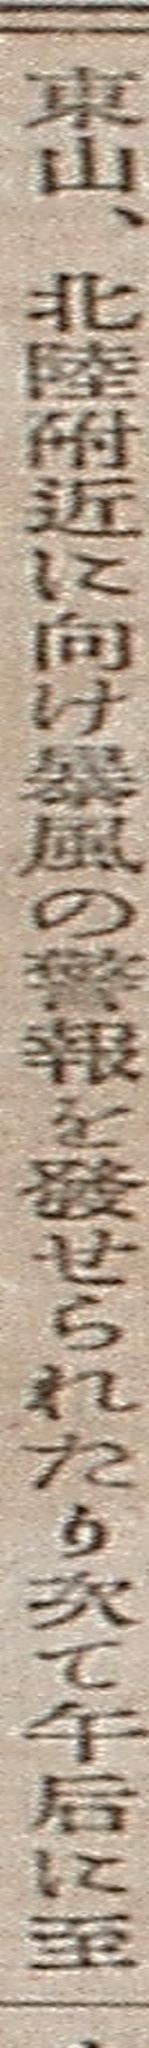東山、北陸附近に向け暴風の警報を発せられたり次て午后に至
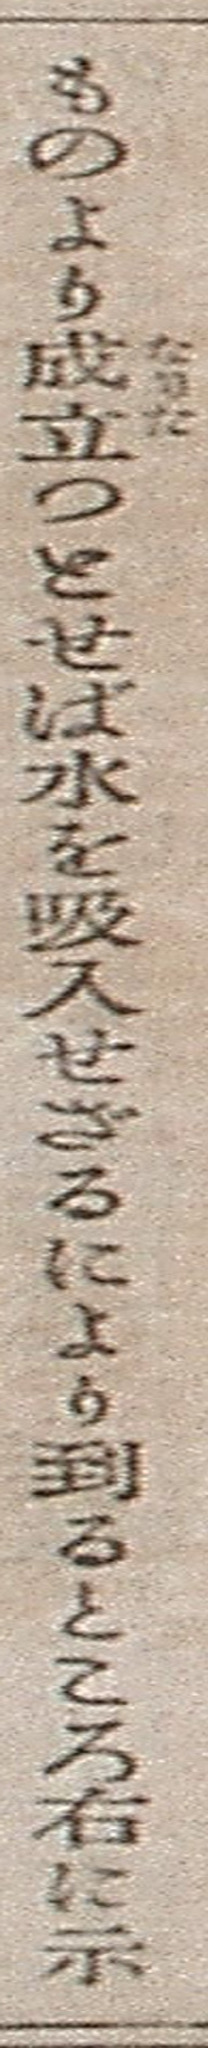ものより成立つとせば水を吸入せざるにより到ろところ右に示

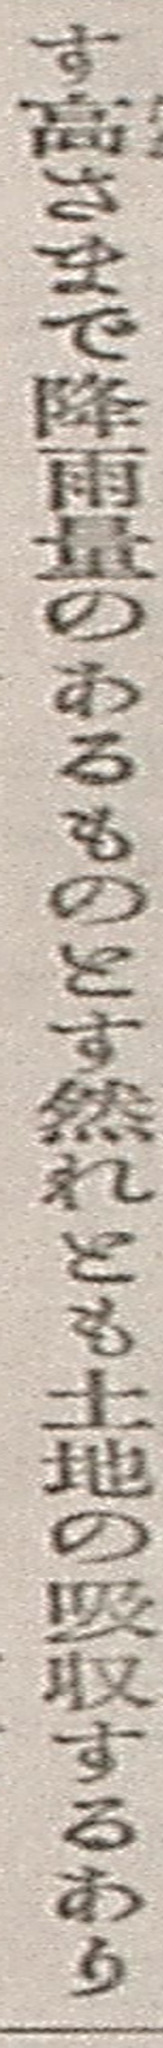す高さまで降雨量のあるものとす然れとも土地の吸収するあり
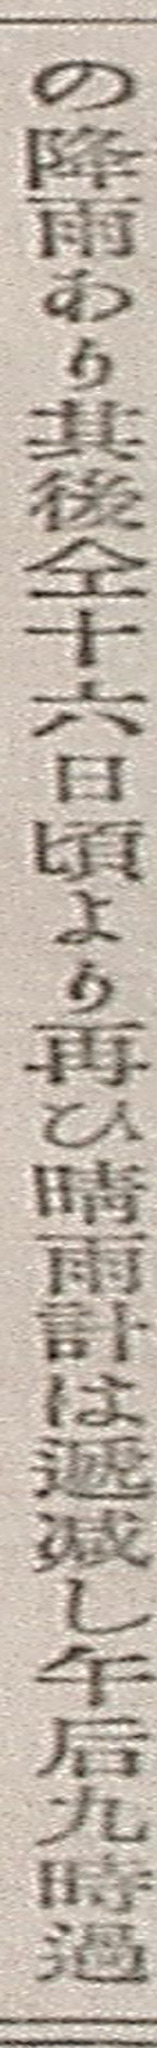の降雨あり其後仝十六日頃より再ひ晴雨計は逓減し午后九時過
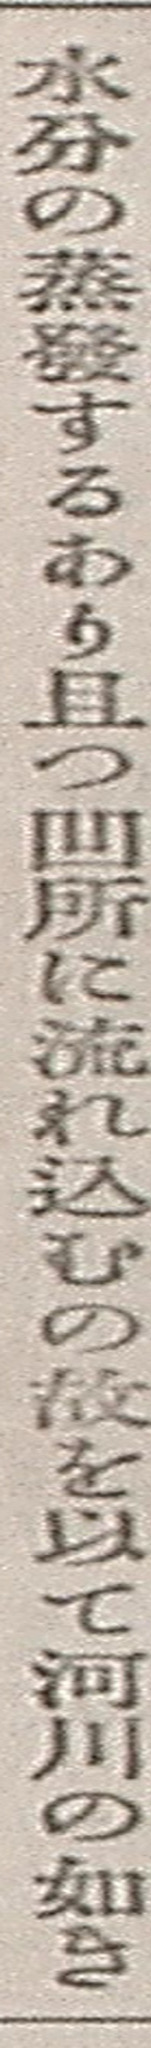水分の蒸発するあり且つ凹所に流れ込むの故を以て河川の如き
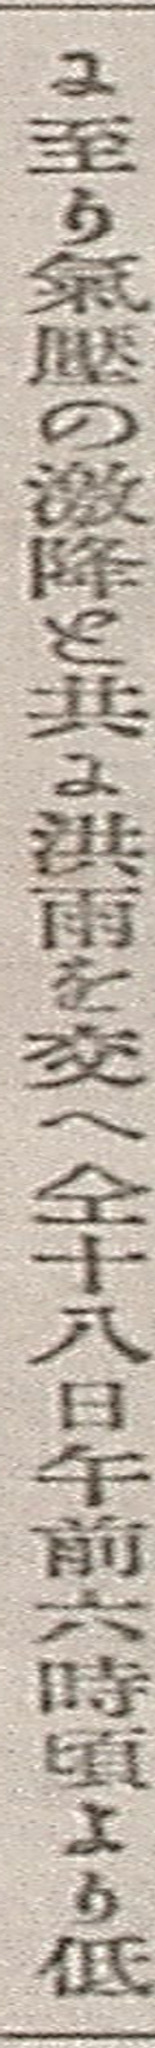に至り気圧の激降と共に洪雨を交へ仝十八日午前六時頃より低
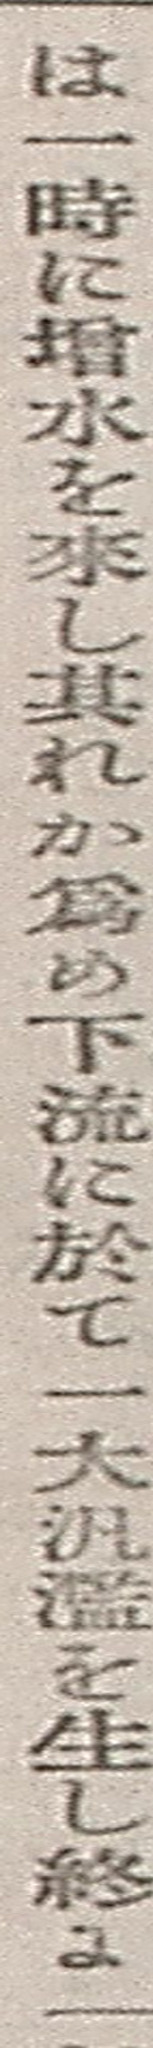は一時に増水を来し其れか為め下流に於て一大氾濫を生し終に
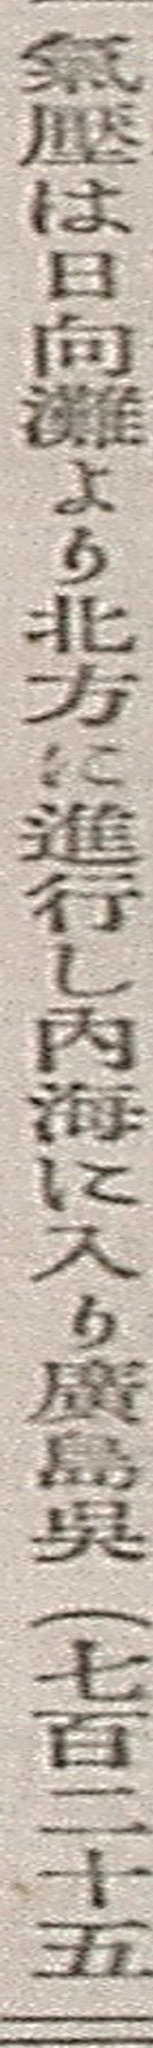気圧は日向灘より北方に進行し内海に入り広島呉（七百二十五
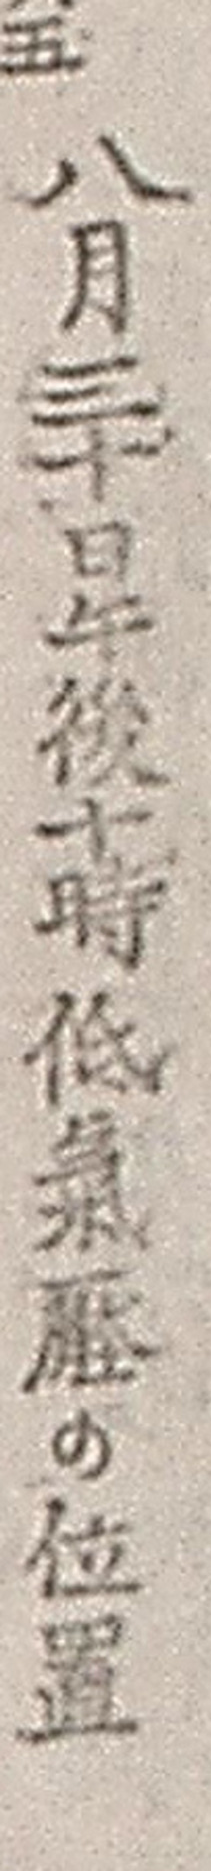八月三十日午後十時低気圧の位置
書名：風俗畫報臨時増刊第百二十四號　洪水地震被害録（上）
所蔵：東京大学地震研究所図書室 Earthquake Research Institute Library, The University of Tokyo, JAPAN
